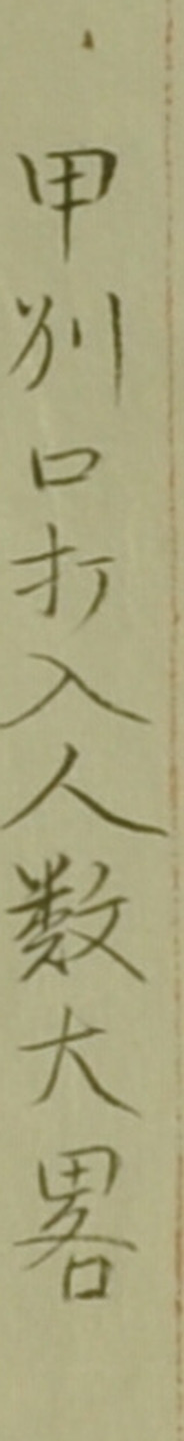甲州口打入人数大略
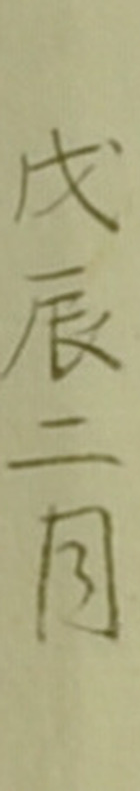戊辰二月
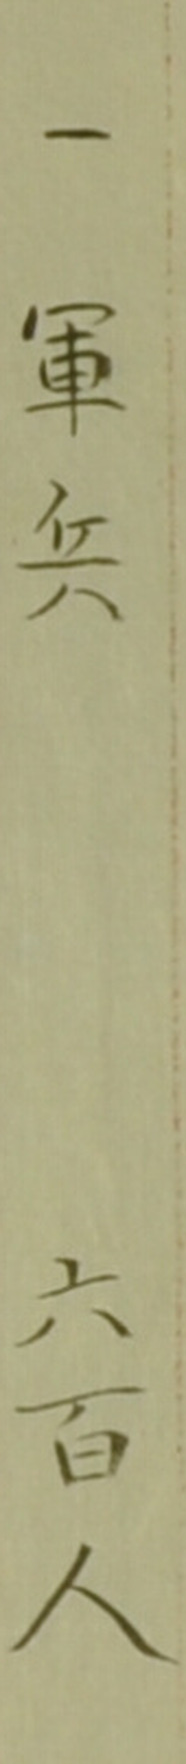一軍兵六百人
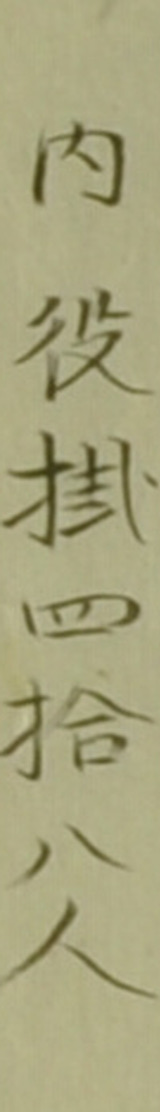内役掛四拾八人
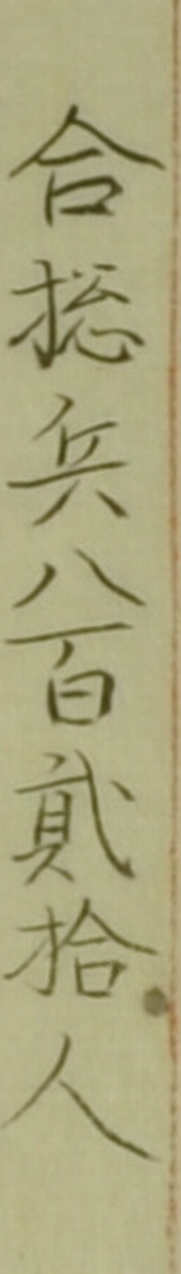合捴兵八百弐拾人
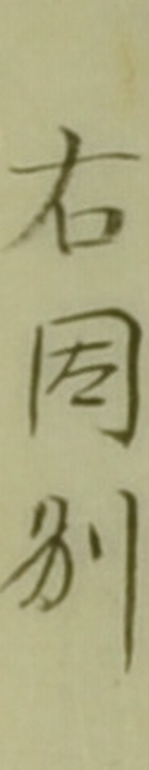右因州
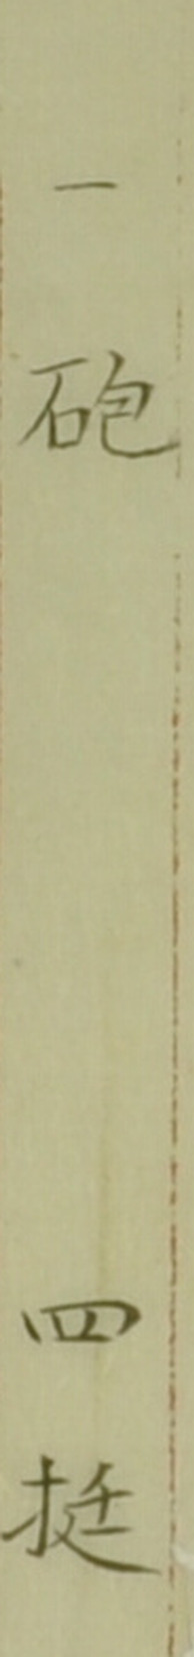一砲四挺
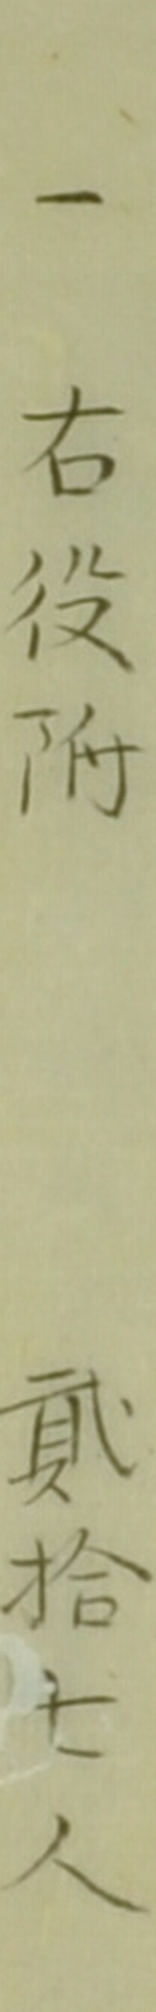一右役附弐拾七人
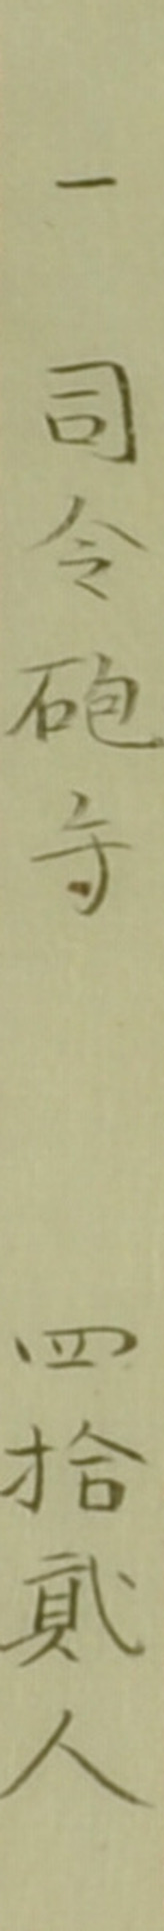一司令砲手四拾弐人
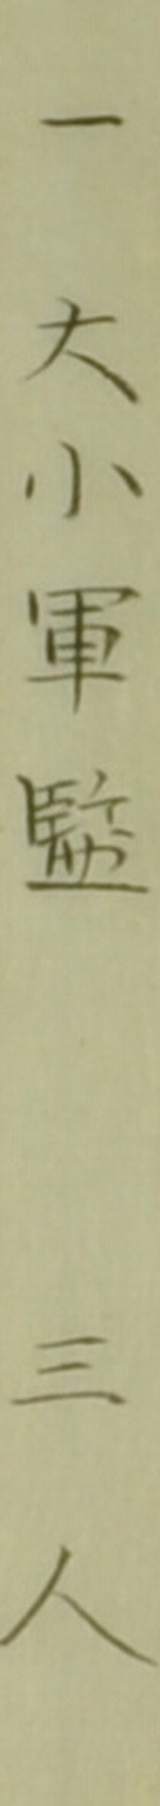一大小軍監三人
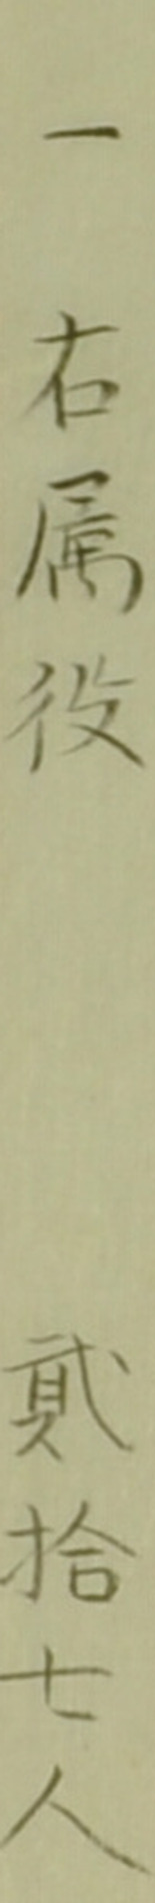一右属役弐拾七人
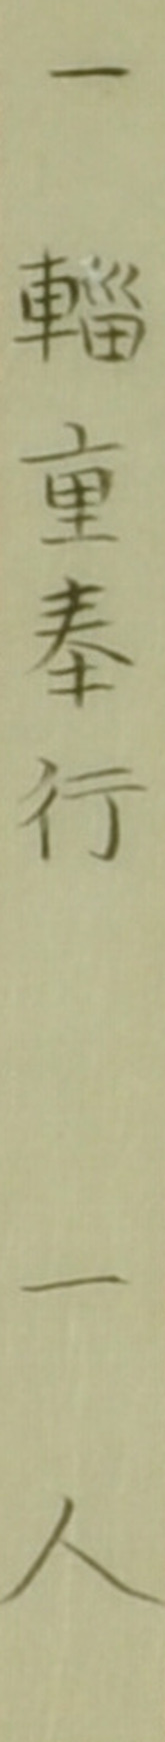一輜重奉行一人
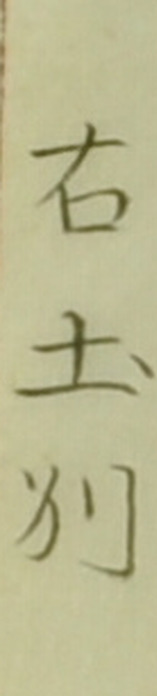右土州

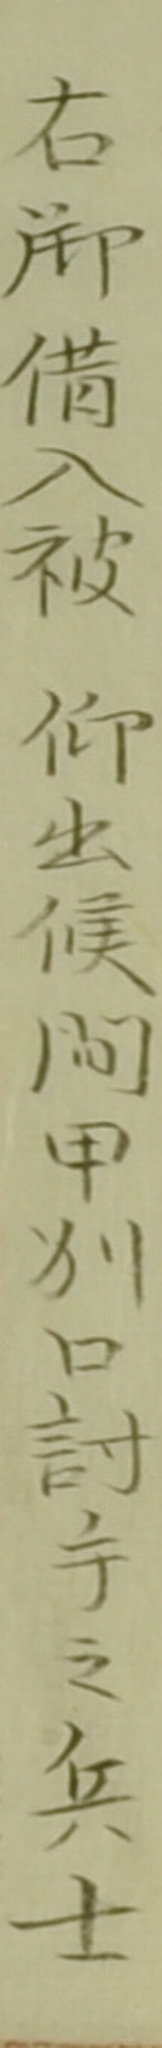右御備入被仰出候間甲州口討手之兵士
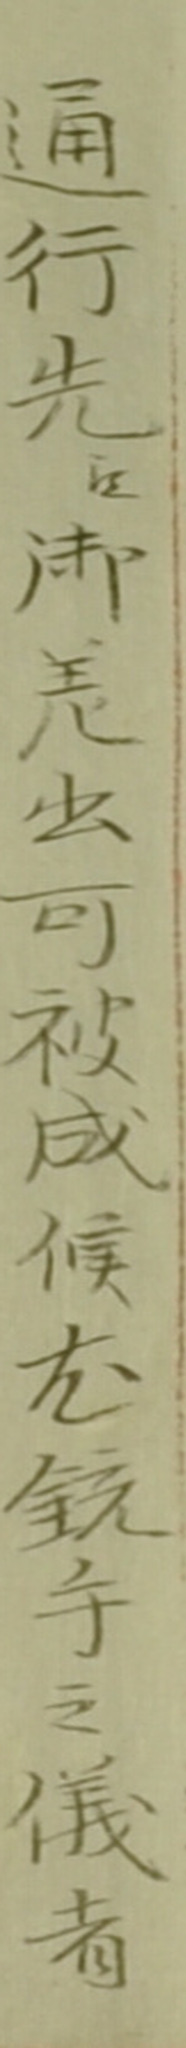通行先江御差出可被成候尤銃手之儀者
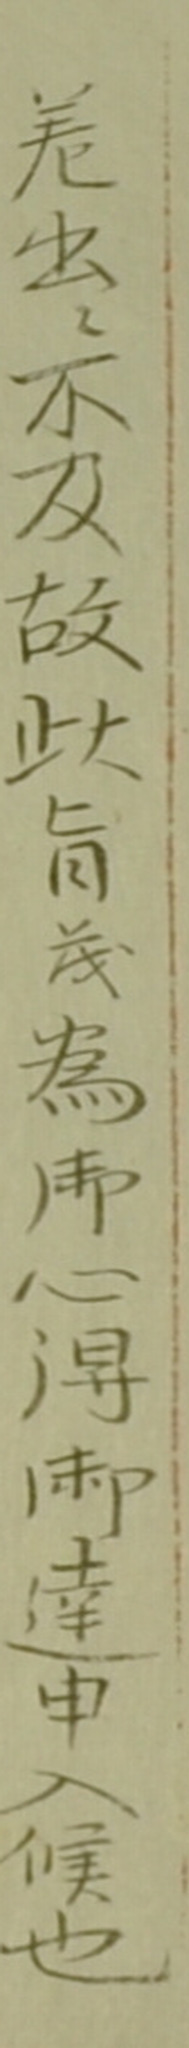差出ニ不及故此旨茂為御心得御達申入候也
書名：御東征ニ付甲州口兵食人馬御賄之事件（控）
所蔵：伊那市立高遠町図書館・合同会社AMANE
